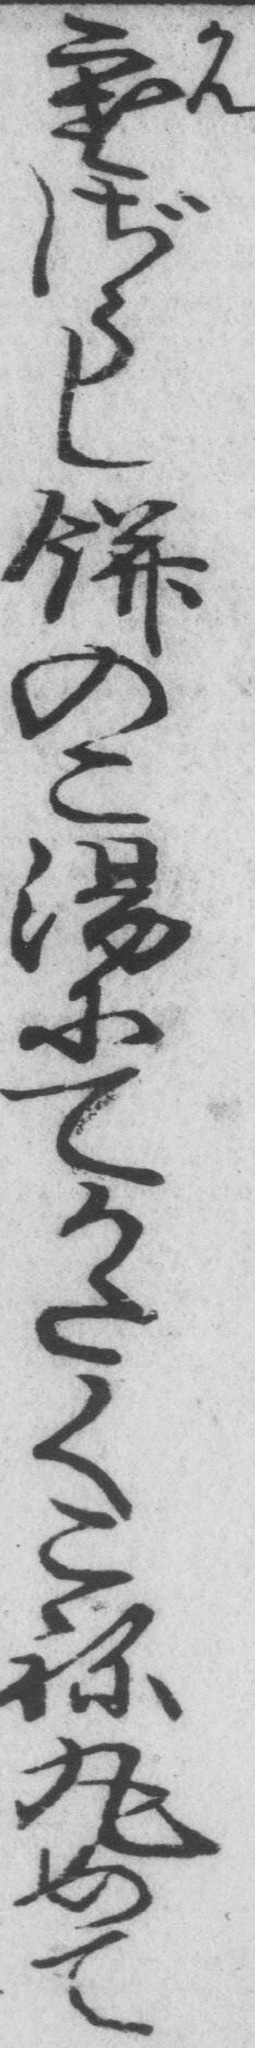寒ざらし餅のこ湯にてかたくこね丸めて
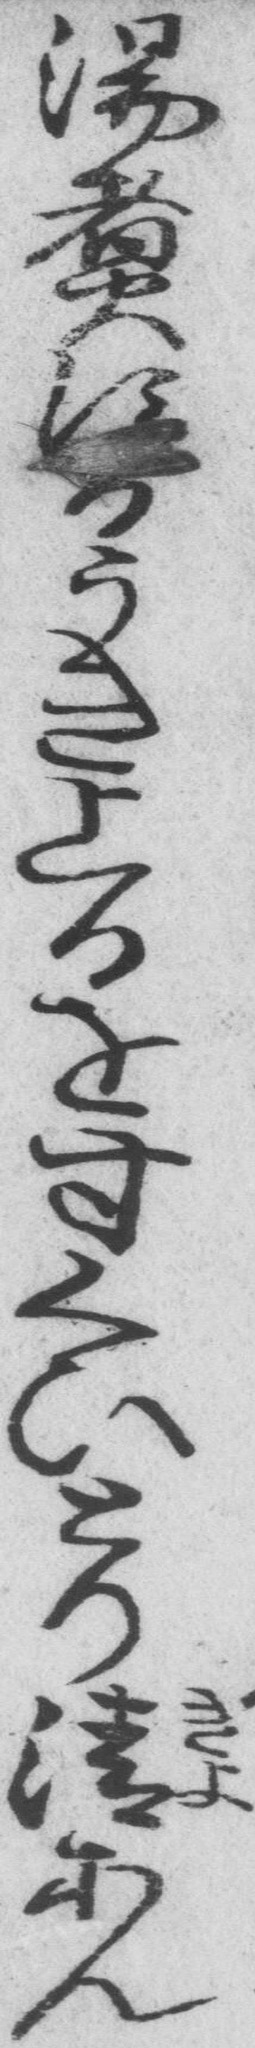湯煮するうき上るをすくひとり清あん
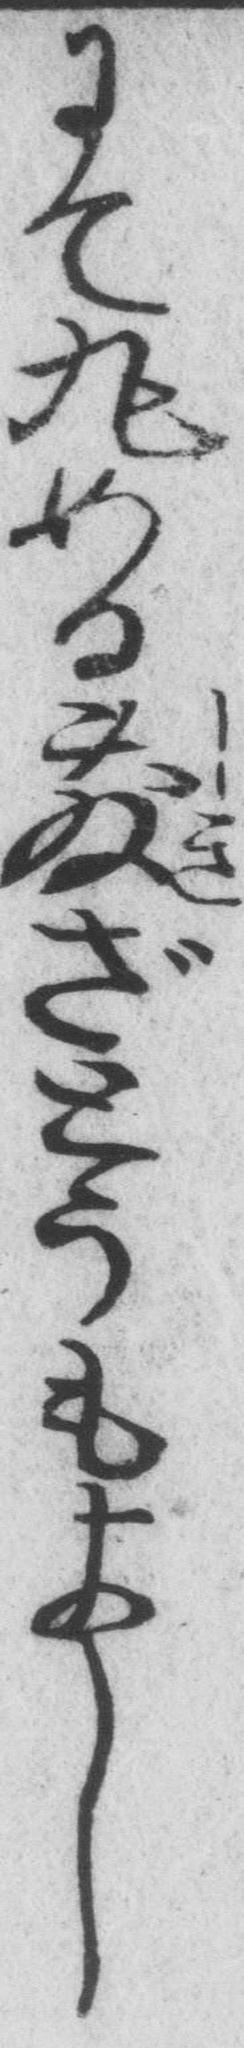にて丸める敷ざとうもよし
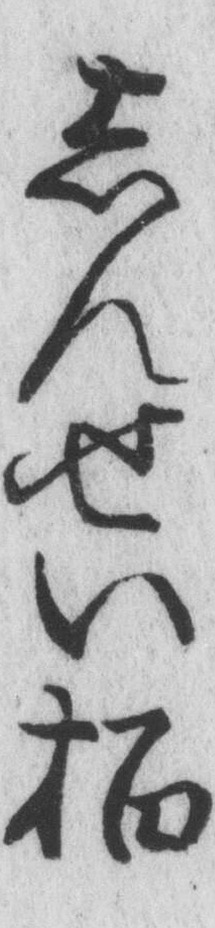しんせい栢
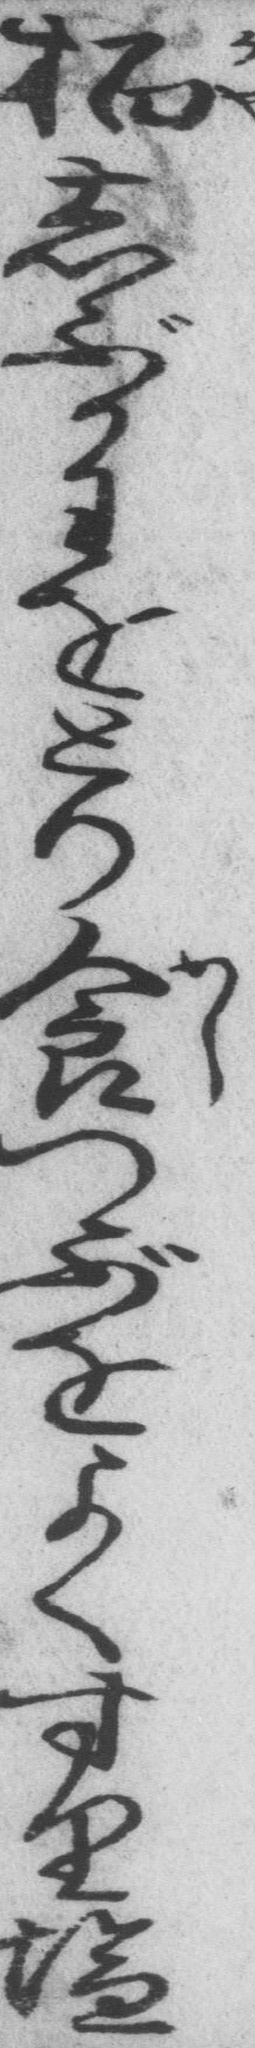栢しぶかわをとり食つぶをよくすり塩
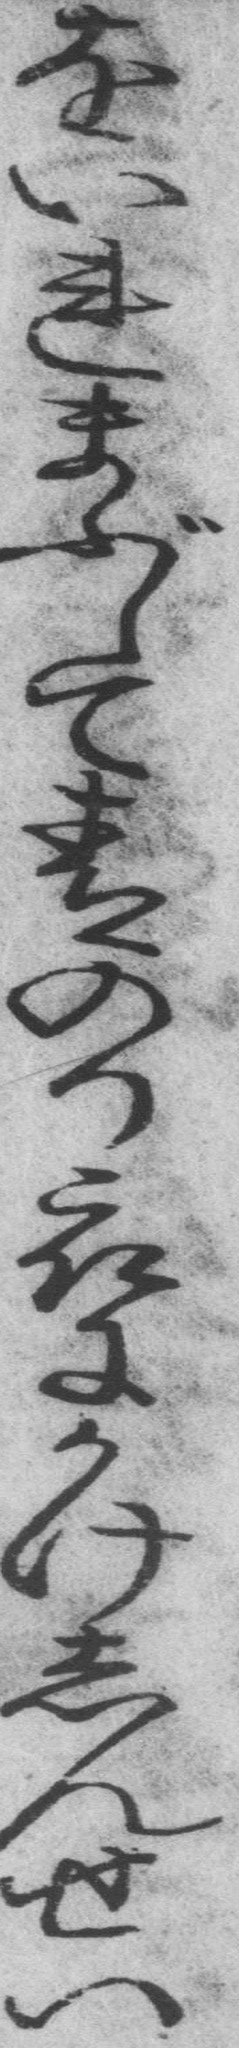をいれまぶして青のり衣にかけしんせい

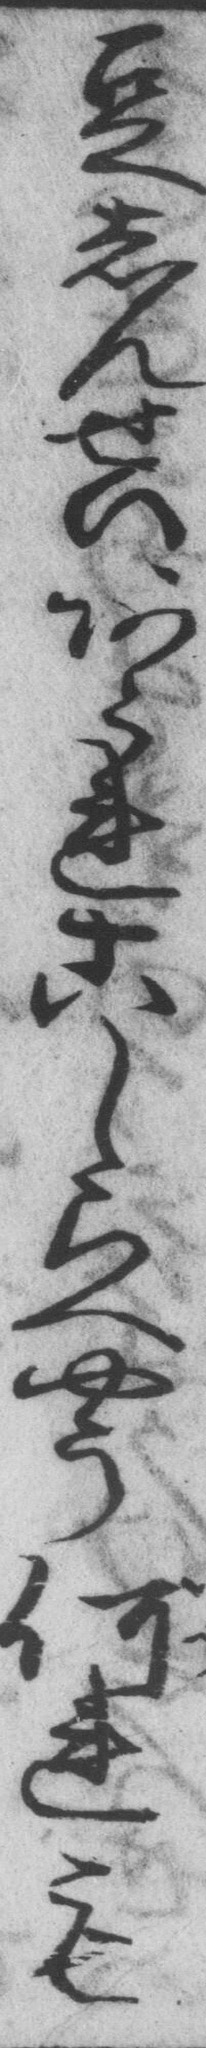豆しんせいあられこしらへやう何れも
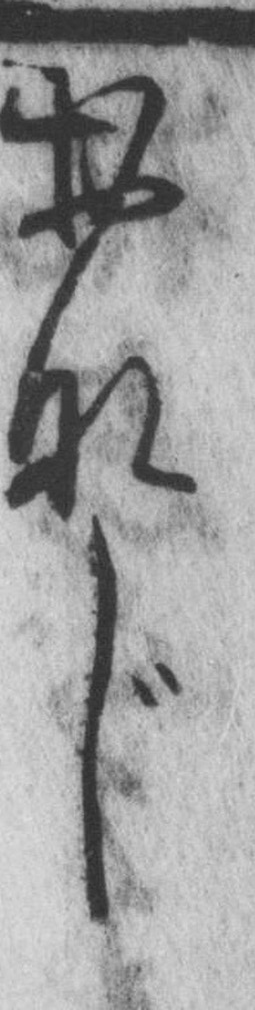おなじ
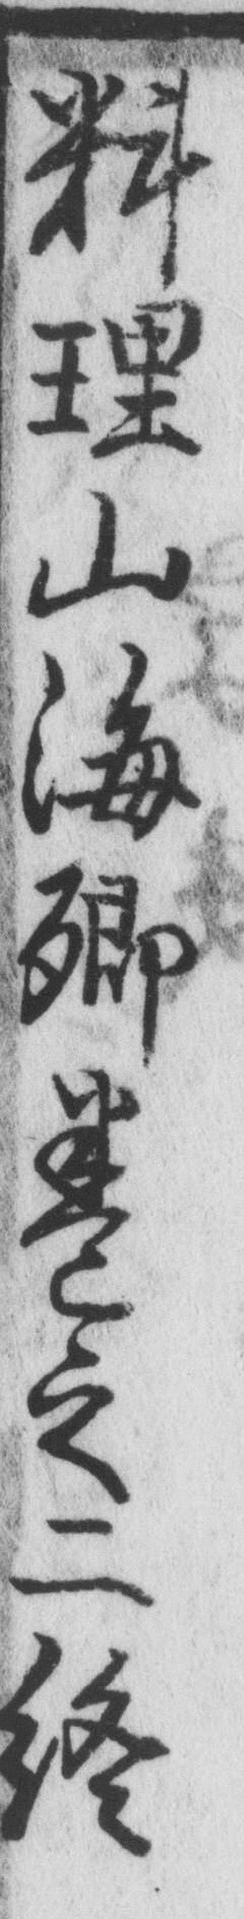料理山海郷巻之二終

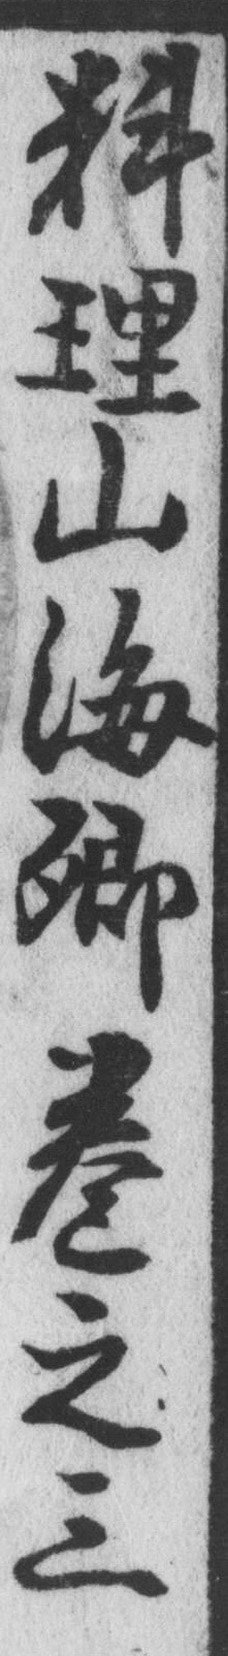料理山海郷巻之三
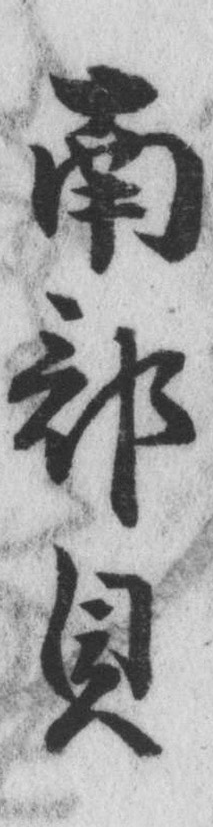南部貝
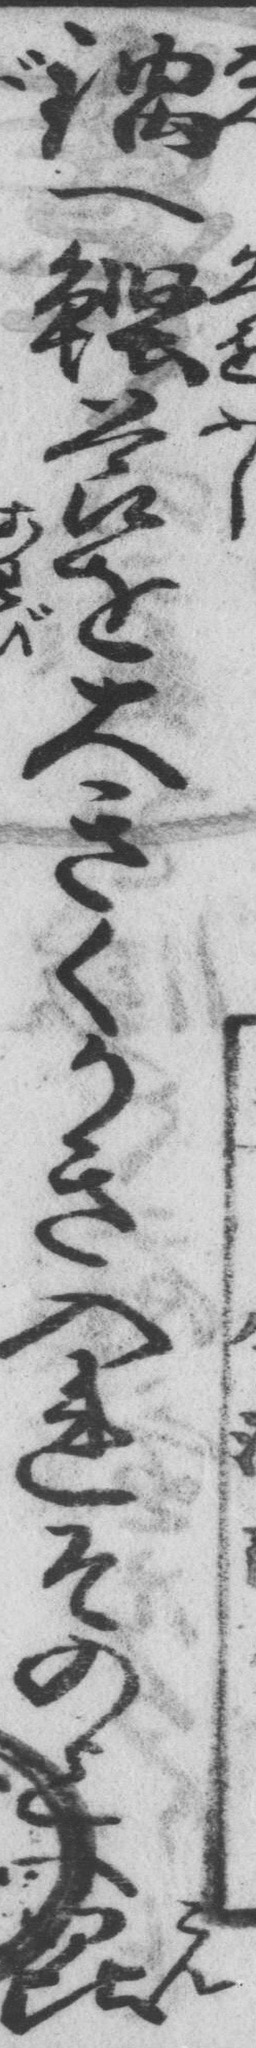鍋へ鰹節を大きくかき入れその上へ昆
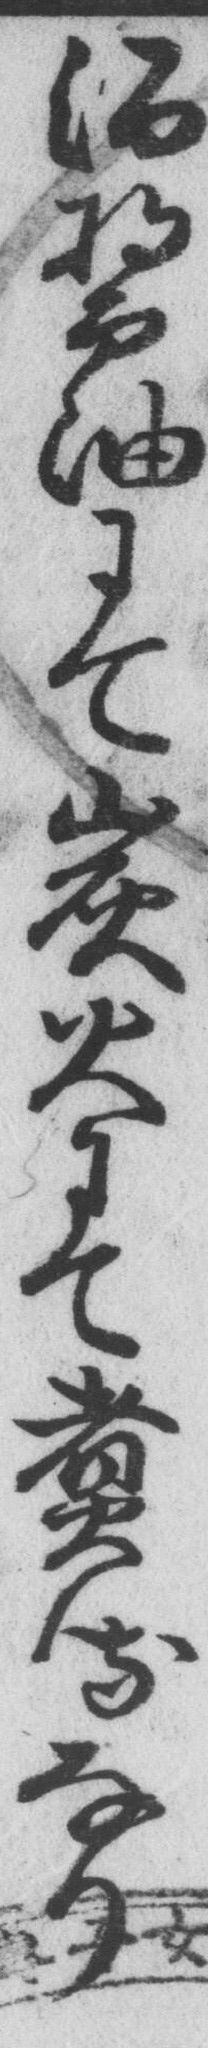酒醤油にて炭火にて煮るなり
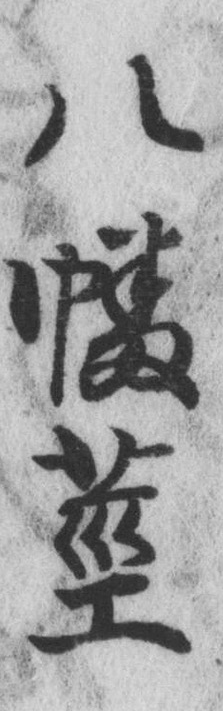八幡茎
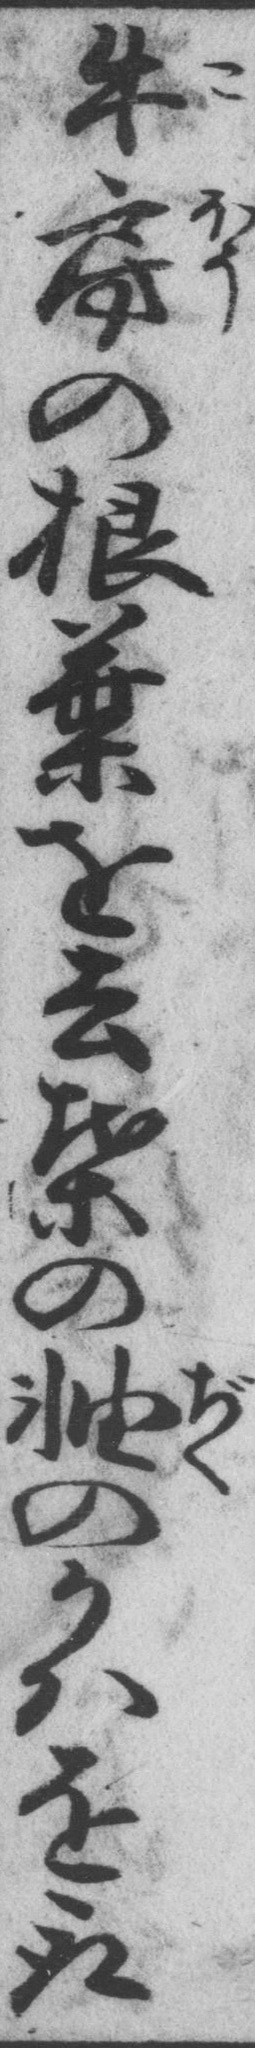牛蒡の根葉を去葉の軸のかはを取

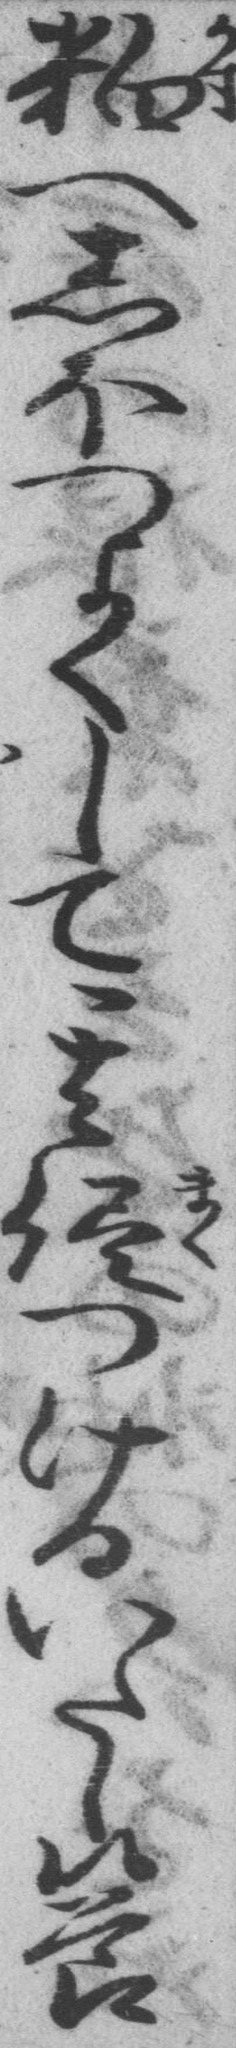粕へしほつよくして其侭つけるいたし候節
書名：料理山海郷
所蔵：大阪府立大学学術情報センター 国文学研究資料館
